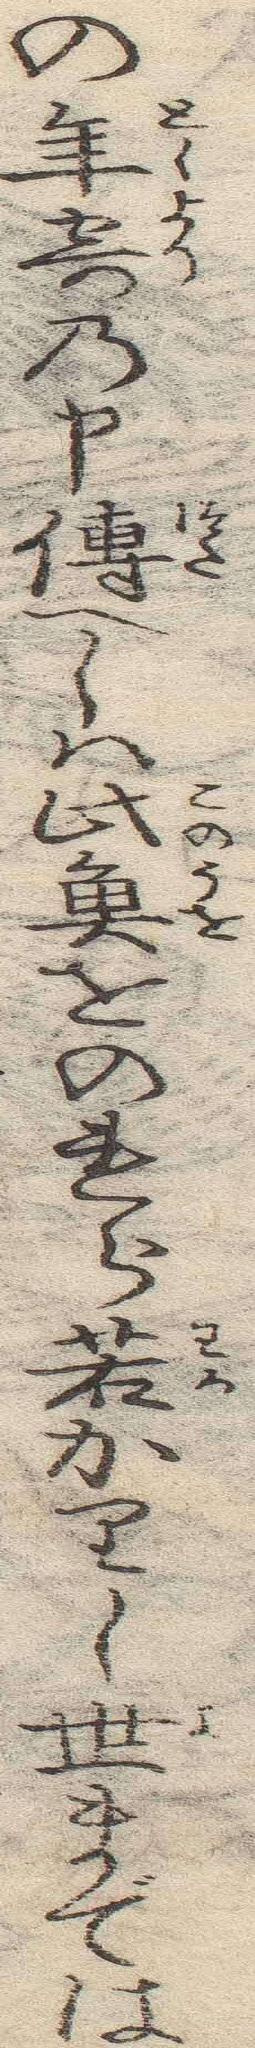の年寄の申伝へしは此魚をのれら若かりし世までは
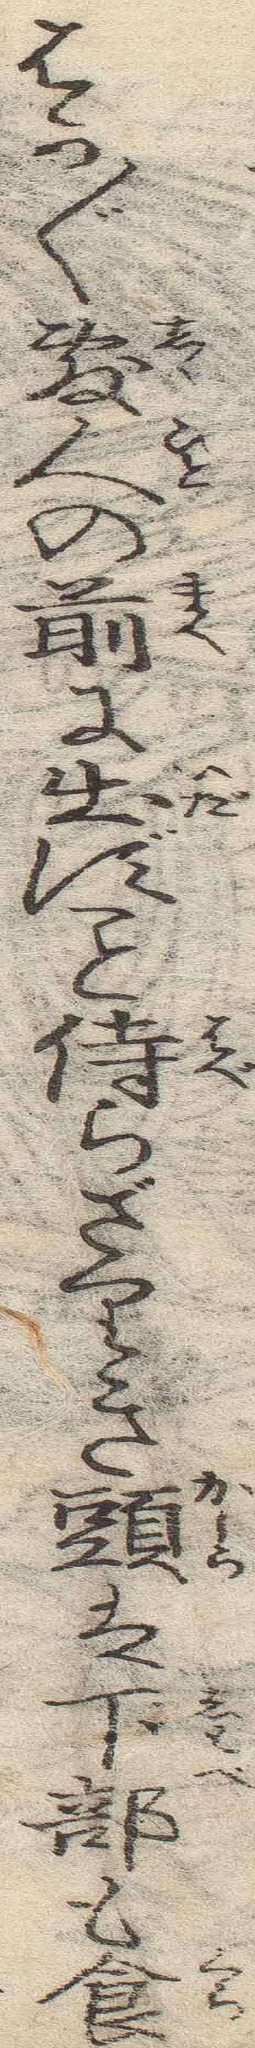はか〴〵敷人の前に出ずこと侍らざりき頭は下部も食
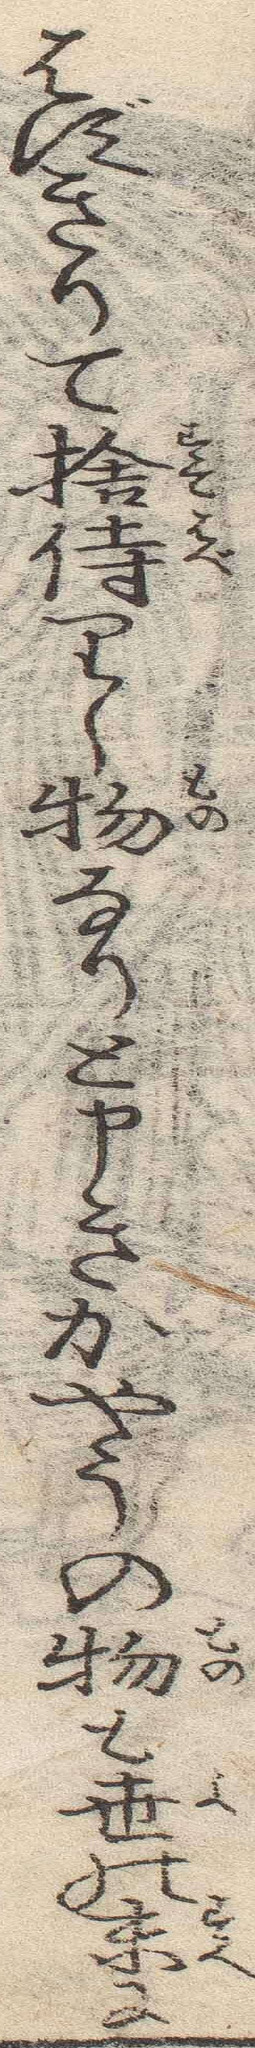はずきりて捨侍りし物なりと申きかやうの物も世の末に
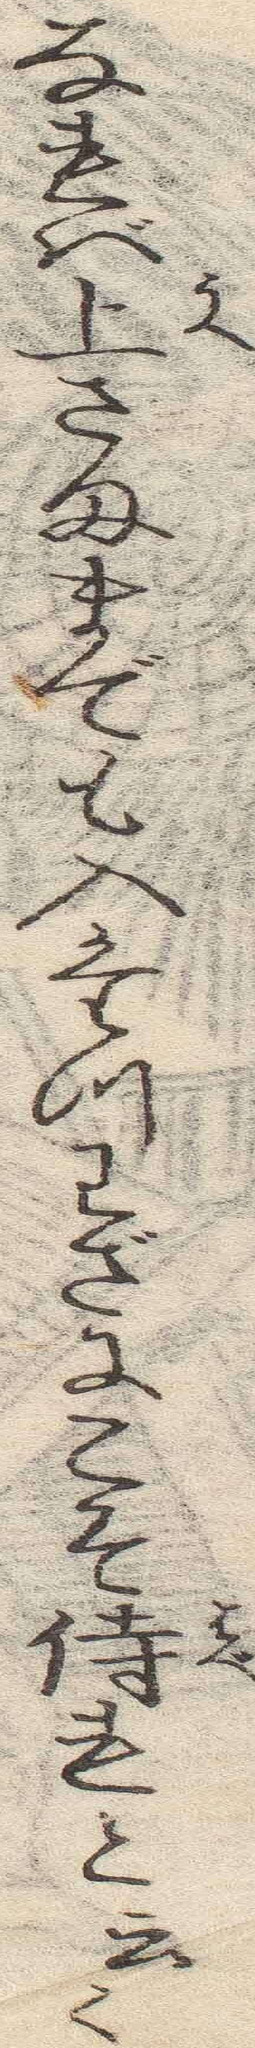なれば上さままでも入たつわざにこそ侍れと云々
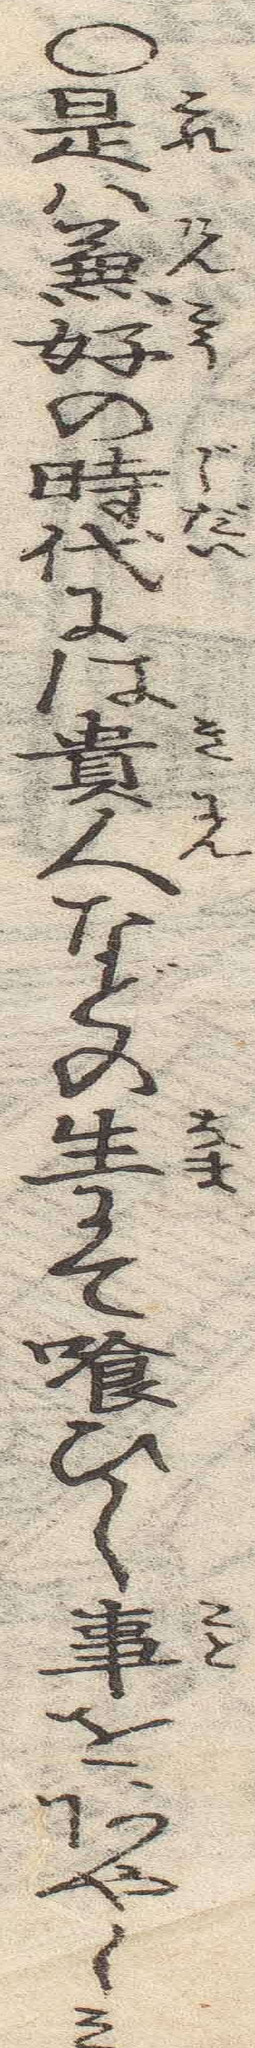○是は兼好の時代には貴人などの生にて喰ひし事をあやしみ
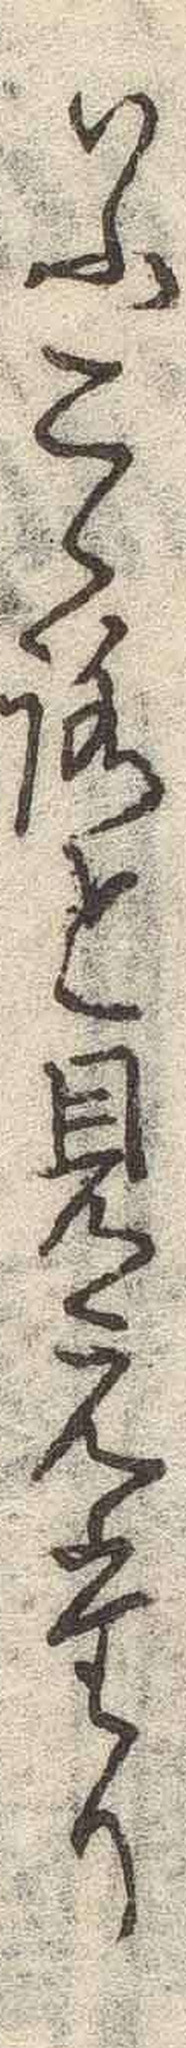いふこゝろと見えたり
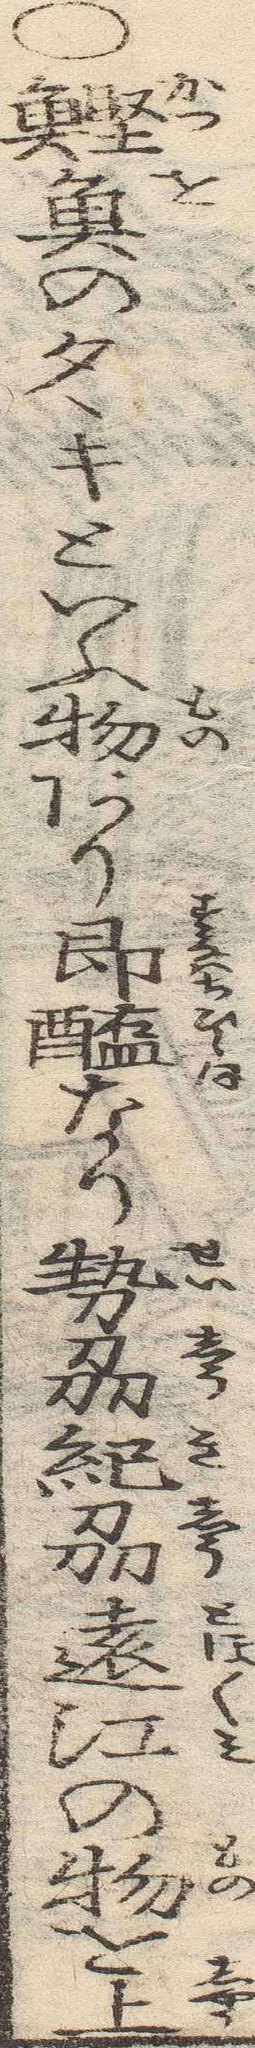○鰹魚のタヽキといふ物なり即醢なり勢州紀州遠江の物を上
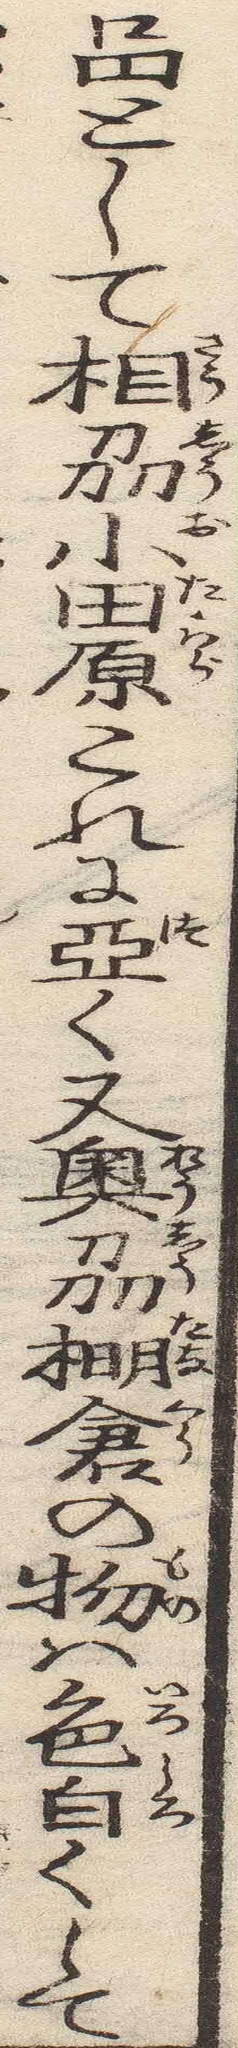品として相州小田原これに亜く又奥州棚倉の物は色白くして
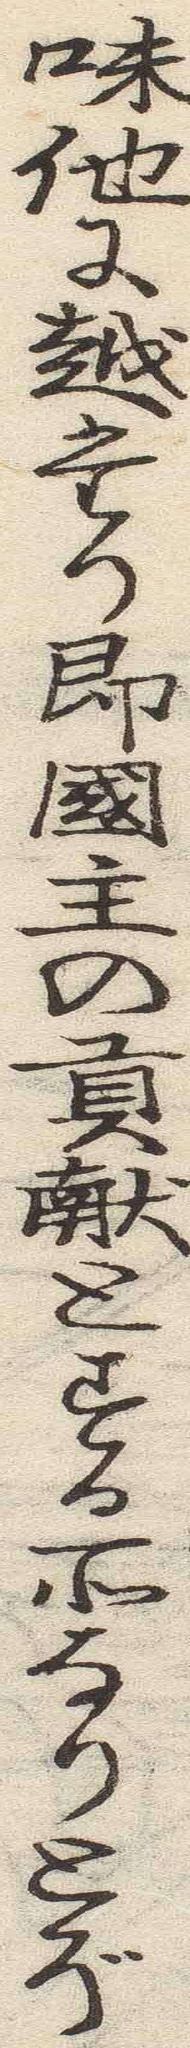味他に越たり即国主の貢献とする所なりとぞ
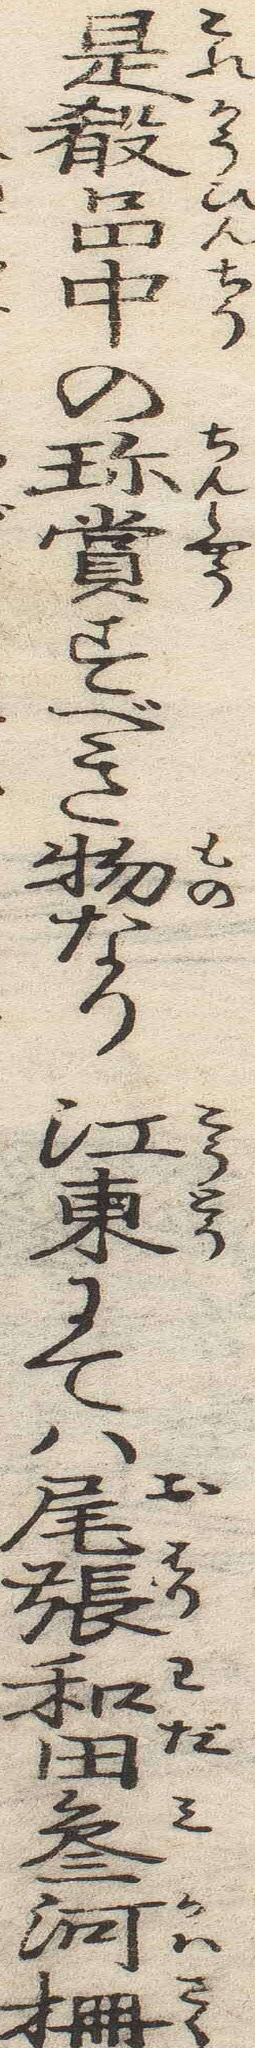是殽品中の珍賞すべき物なり江東にては尾張和田参河柵
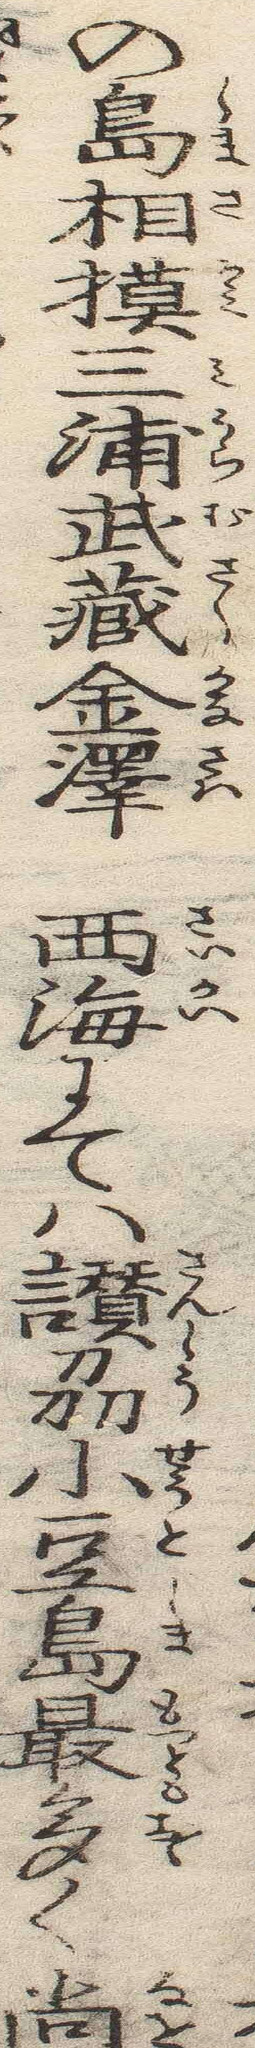の島相模三浦武蔵金沢西海にては讃州小豆島最多く尚
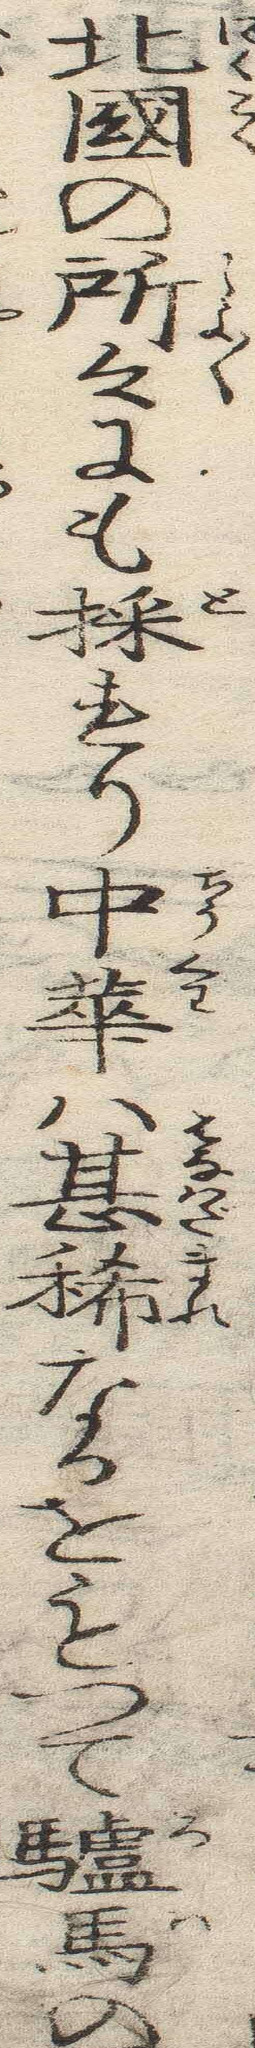北国の所々にも採れり中華は甚稀なるをもつて驢馬の
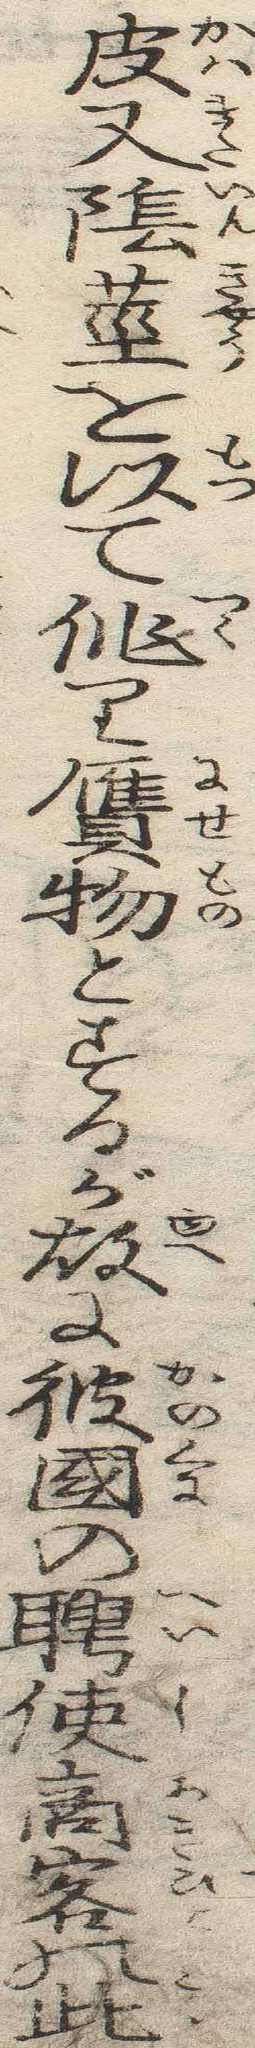皮又陰茎を以て作り贋物とするが故に彼国の聘使商客の此
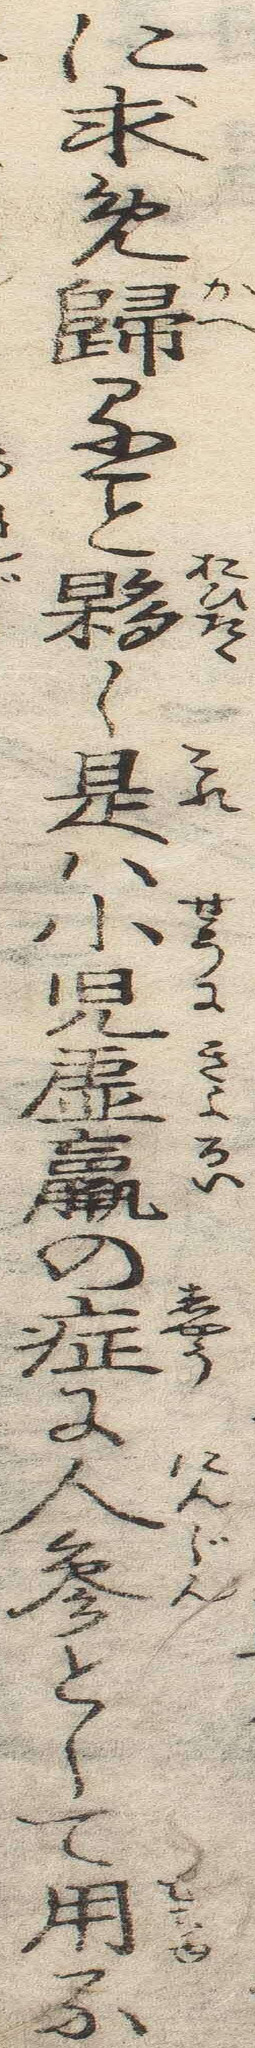に求め帰ること夥し是は小児虚羸の症に人参として用る
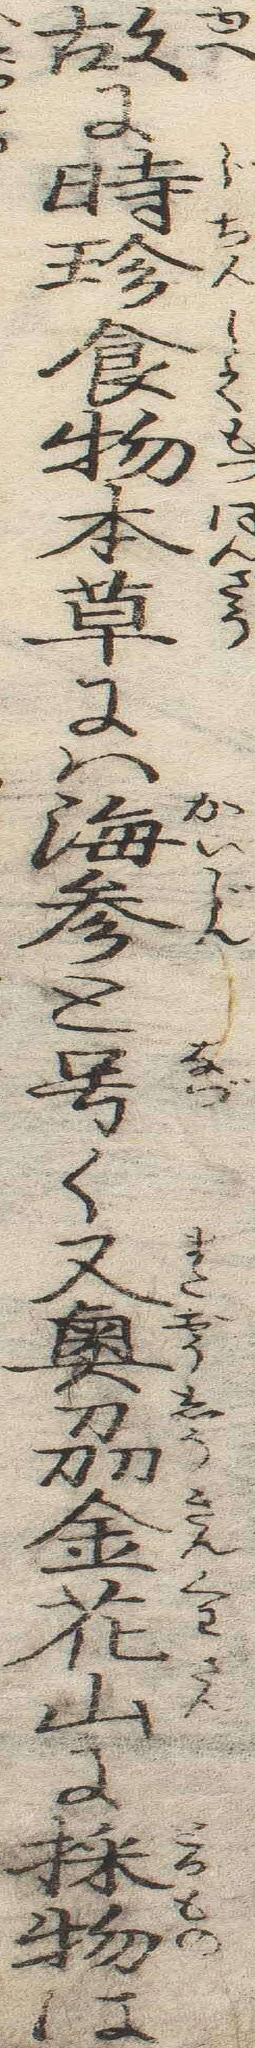故に時珍食物本草には海参と号く又奥州金花山に採物は
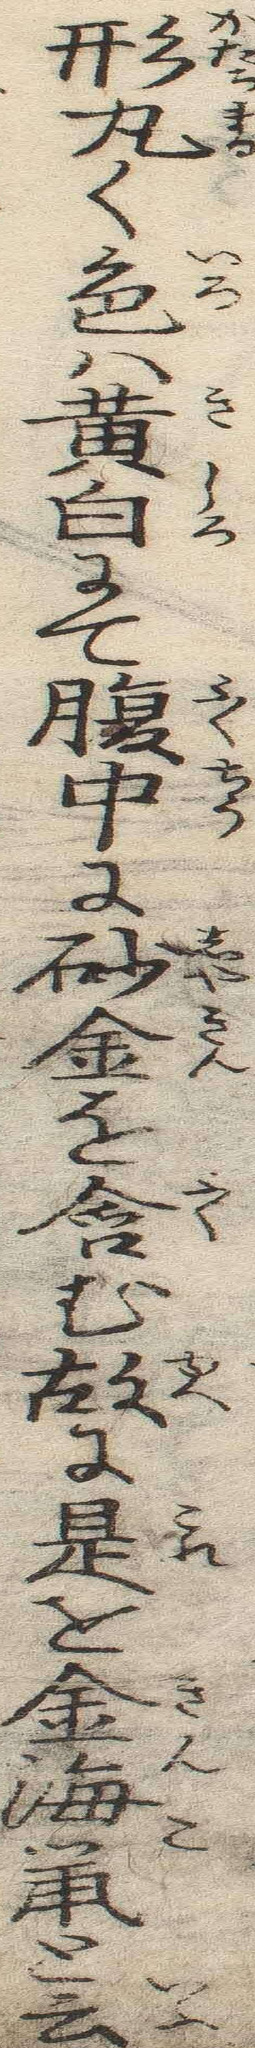形丸く色は黄白にて腹中に砂金を含む故に是を金海鼠と云
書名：日本山海名産図会
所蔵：東京学芸大学附属図書館 国文学研究資料館
